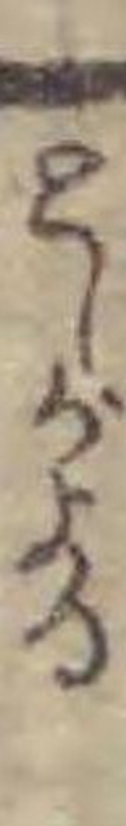としがよる
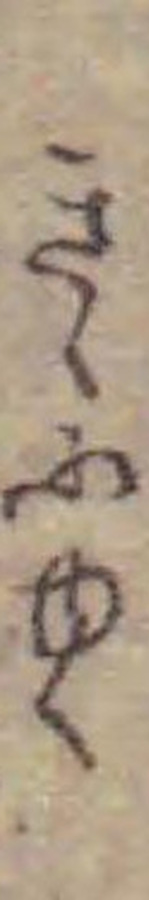きゝにゆく
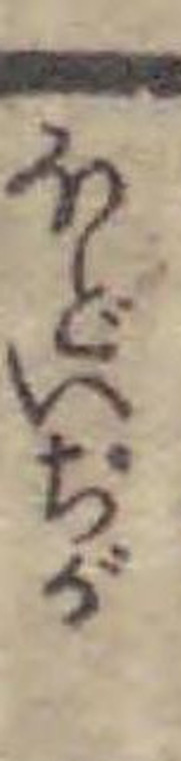ほどいぢが
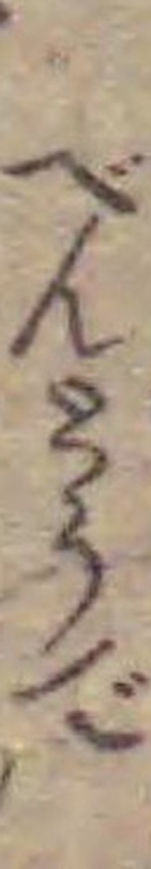べんとうで
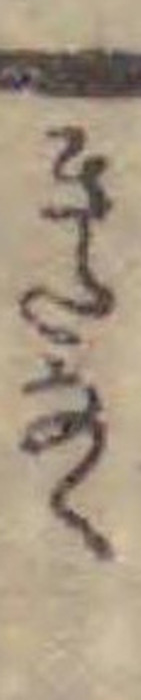きたなく
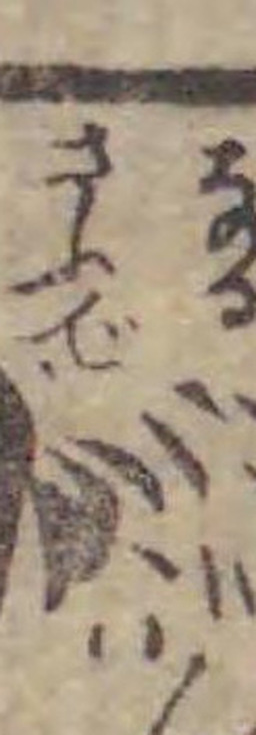さふで
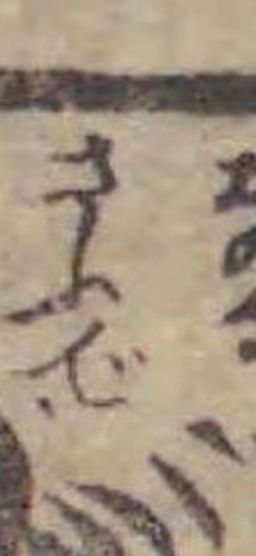さふで
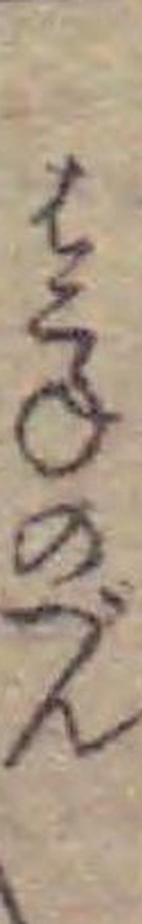はこねのべん
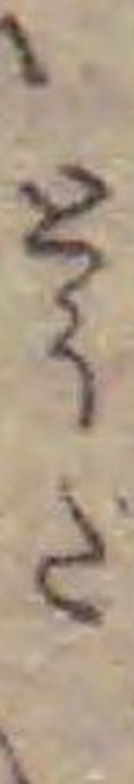とうだ
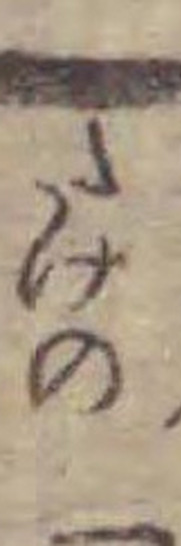たけの
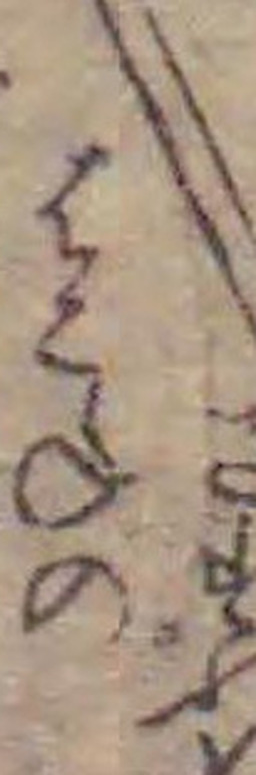はこねの
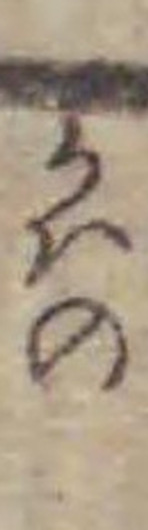かはの
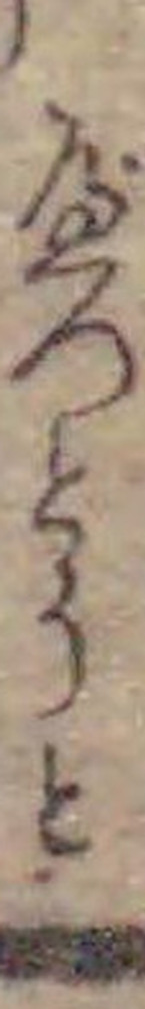べつとうと
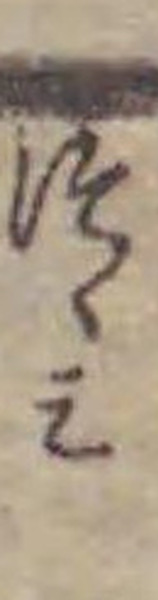つゝみ
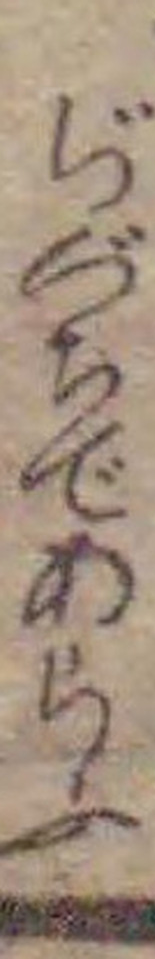ぢづちであらふ
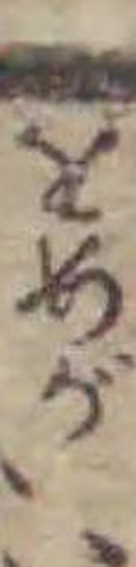をめが
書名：年寄之冷水曽我 : 3巻
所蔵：国立国会図書館 National Diet Library, JAPAN
